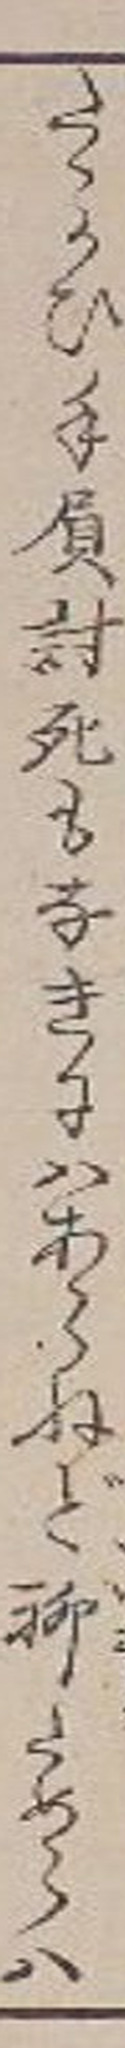たゝかひ、手負討死もなきにはあらねど、聊ためらは
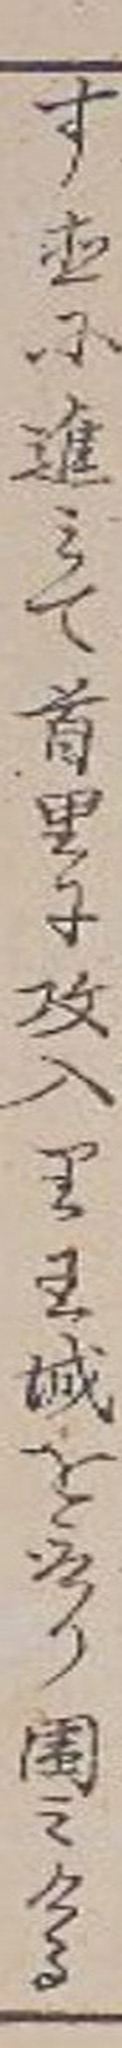ず直に進みて、首里に攻入り、王城を取り囲みける
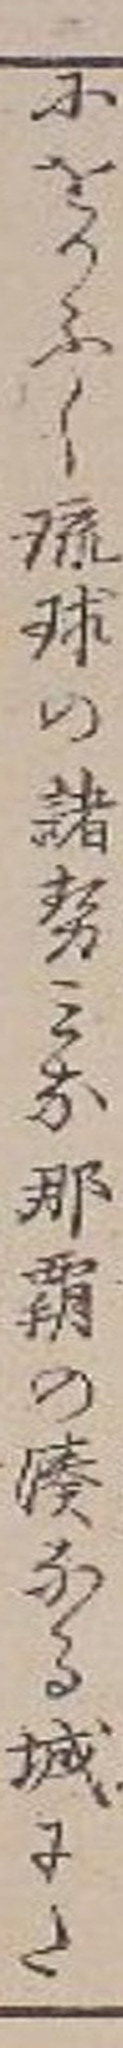に、をりふく琉球の諸勢、みな那覇の湊なる城にた
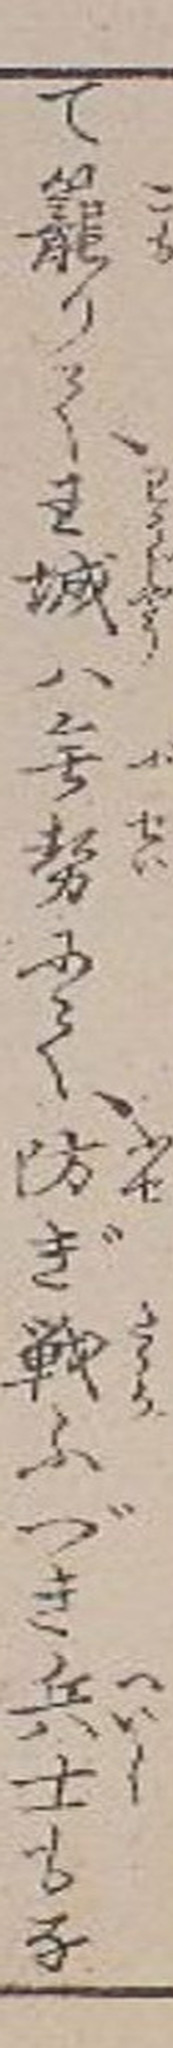て籠りて、王城は無勢にて、防ぎ戦ふべき兵士もな
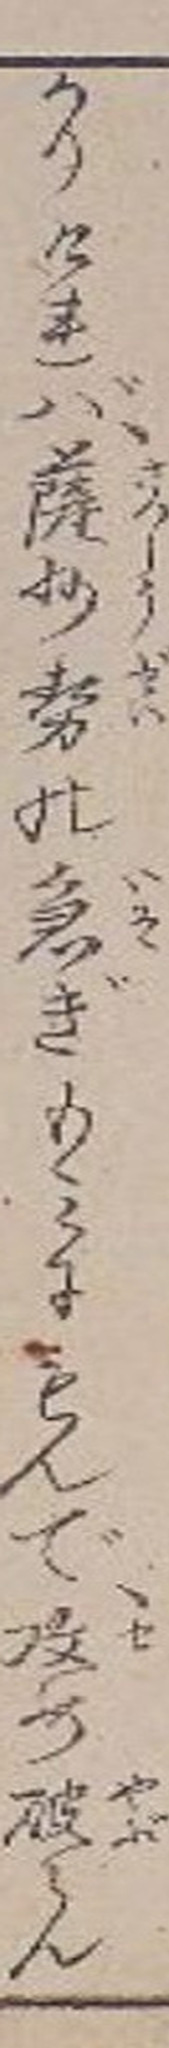かりければ、薩州勢の急ぎもみにもんで、攻め破らん
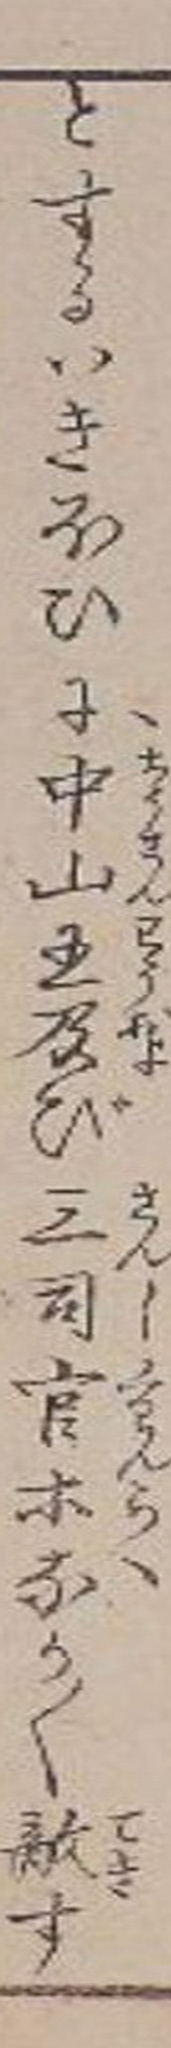とするいきほひに、中山王及び三司官等、なか〳〵敵す

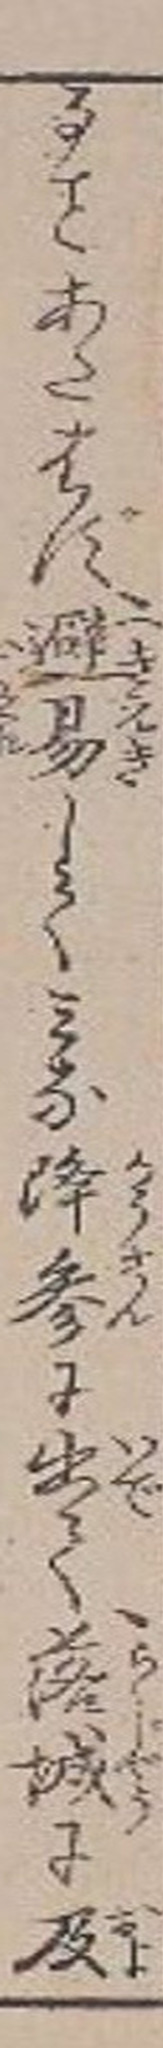ることあたはず、避易してみな降参に出て、落城に及
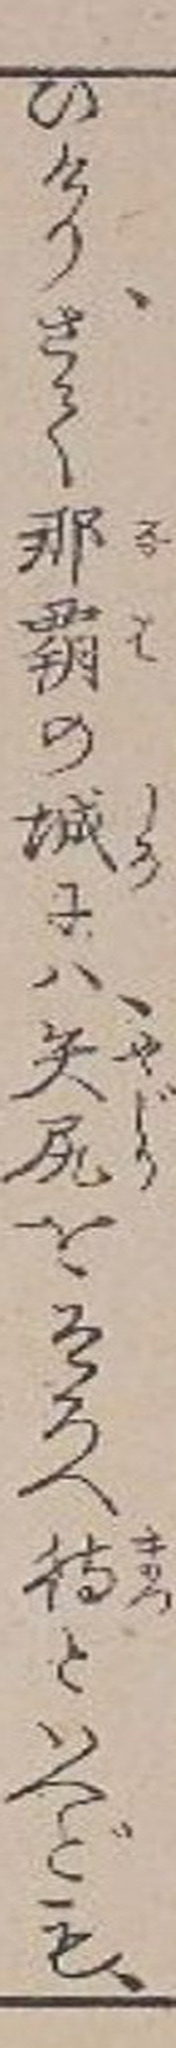ひけり、さて那覇の城には矢尻をそろへ待といへども、
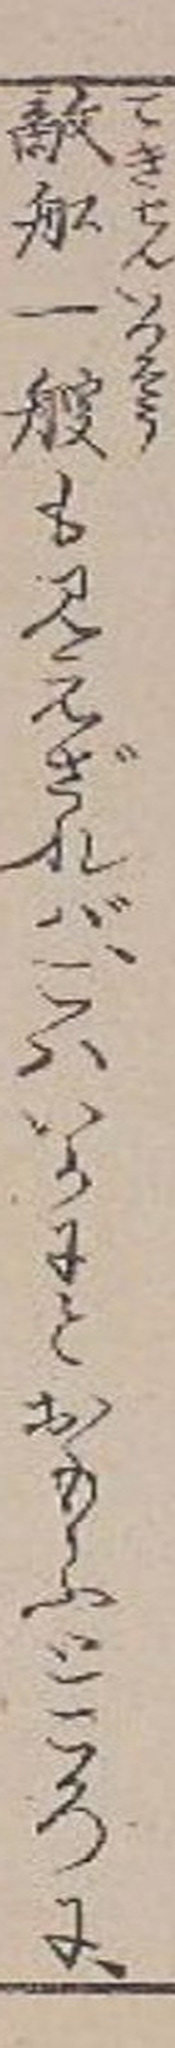敵船一艘も見えざれば、こはいかにとおもふところに、
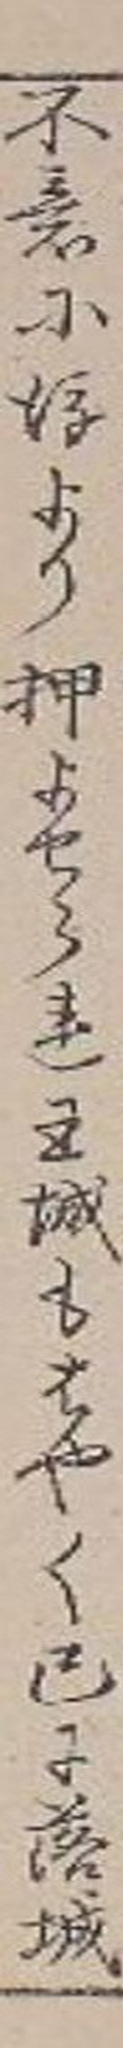不意に後より押よせられ、王城もはやく已に落城
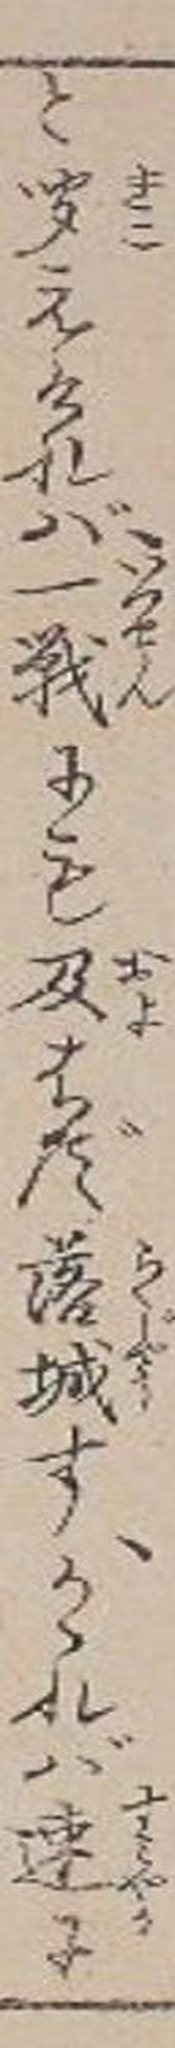と聞えければ、一戦にも及はず落城す、かゝれば速に
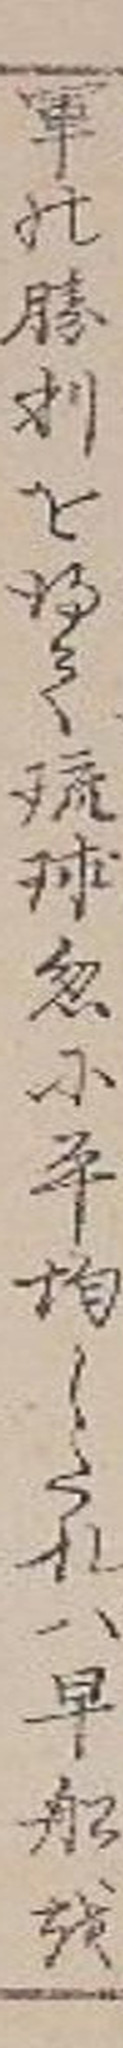軍の勝利を得て、琉球忽に平均したれば、早船を
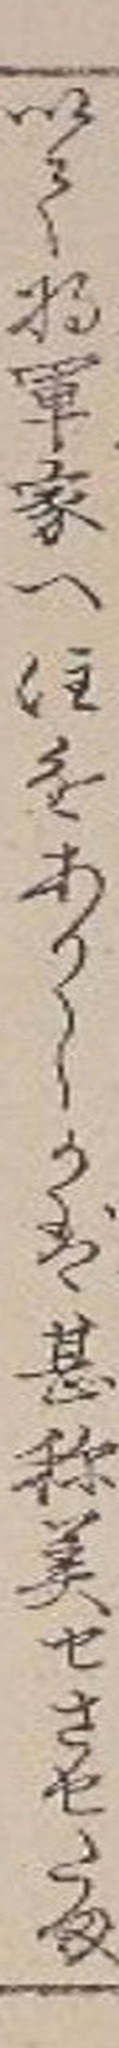以て将軍家へ注進ありしかば、甚称美せさせたま
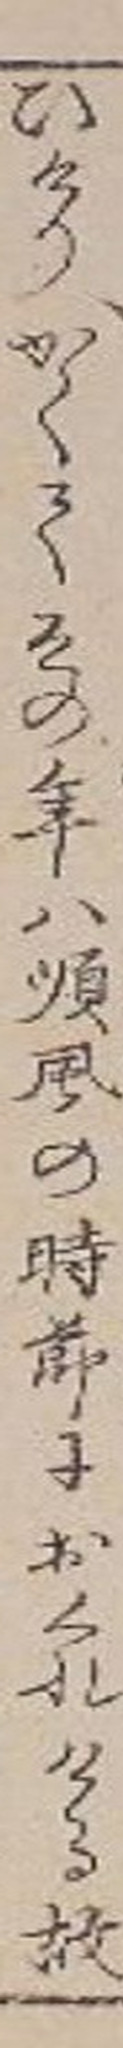ひけり、かくてその年は順風の時節におくれける故
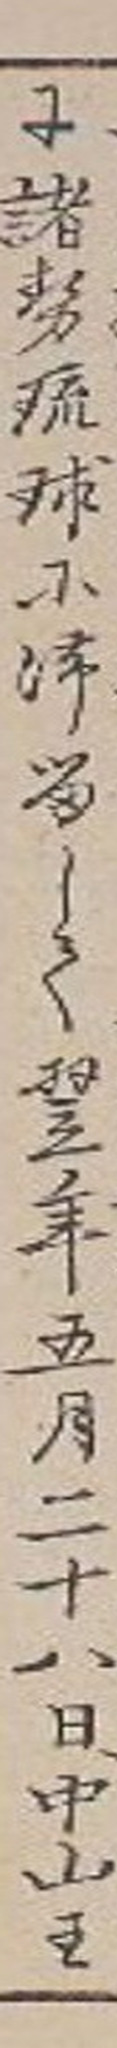に、諸勢琉球に滞留して、翌年五月二十八日、中山王
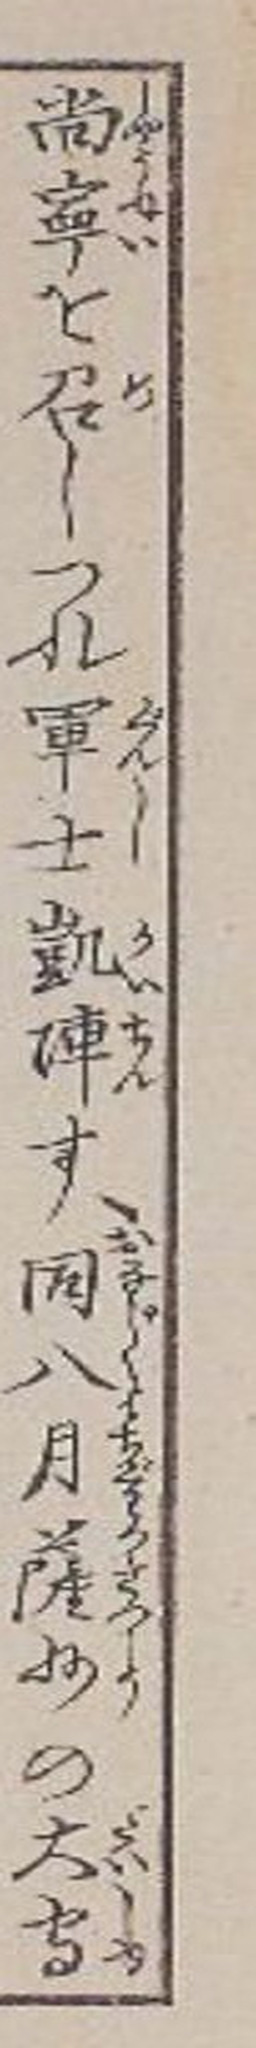尚寧を召しつれ軍士凱陣す、同八月薩州の大守
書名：琉球入貢紀略
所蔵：University of the Ryukyus Library
